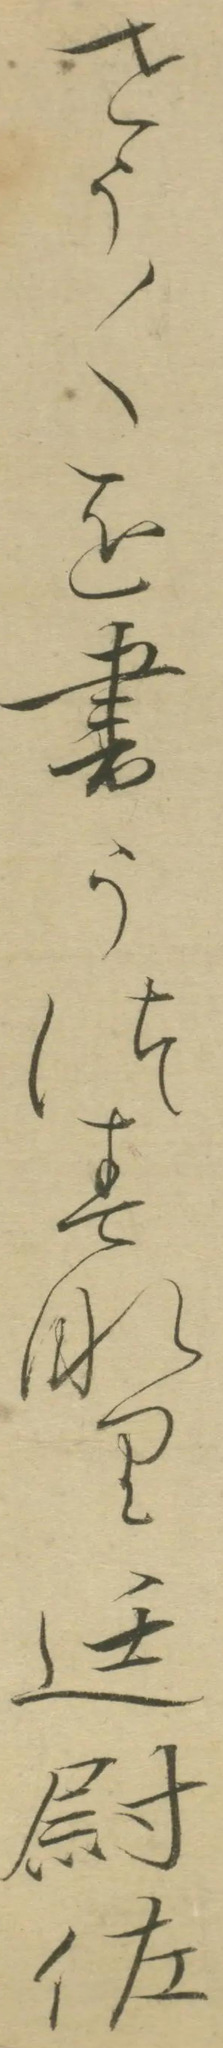せう〳〵を書うつすなり廷尉佐
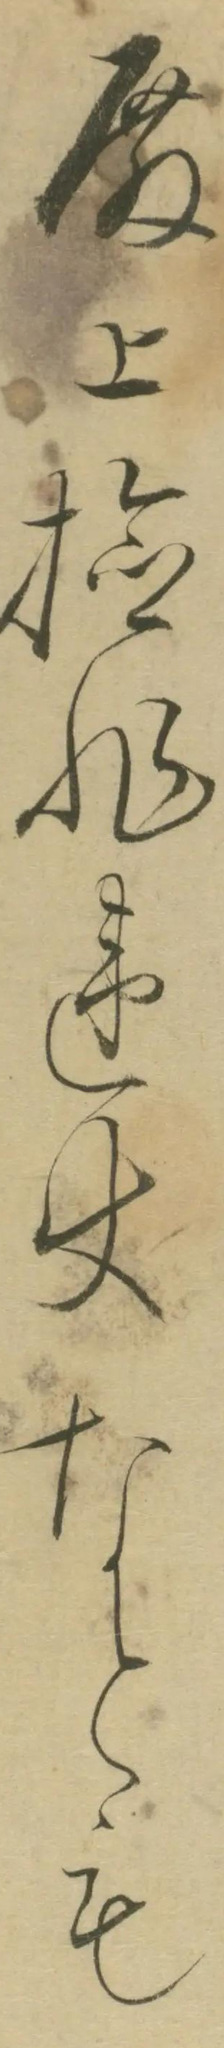殿上撿非違使なとも
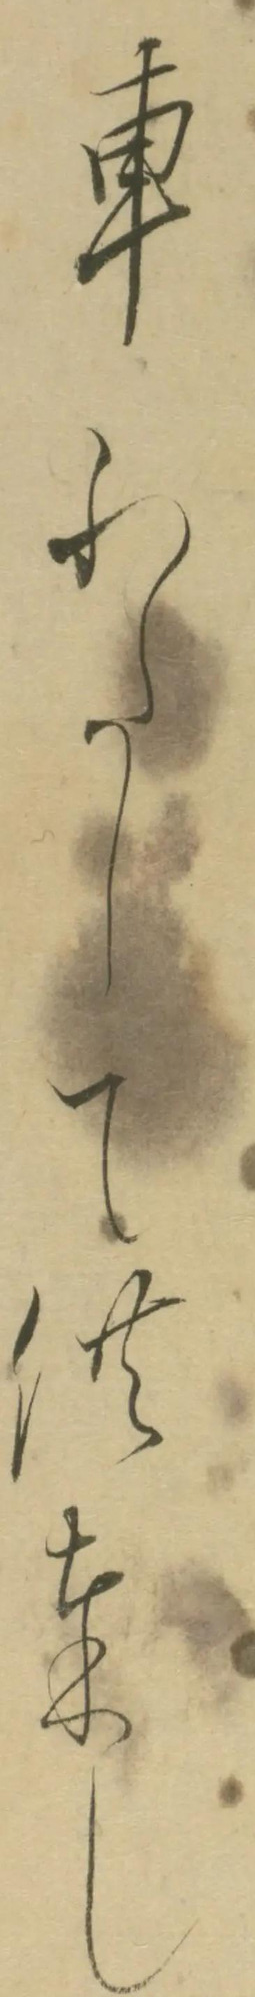車わたして供奉し
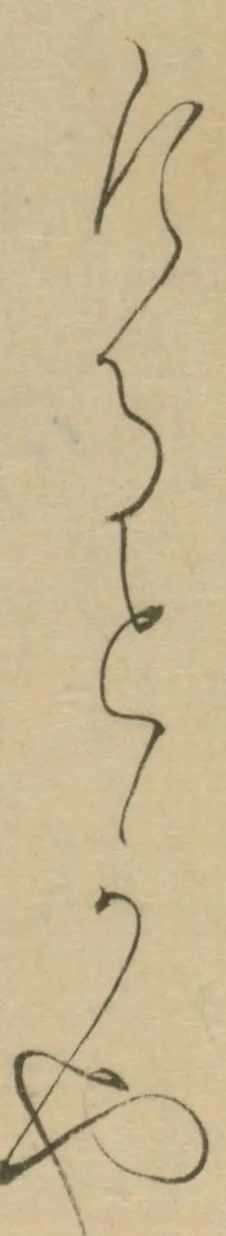けるとかや
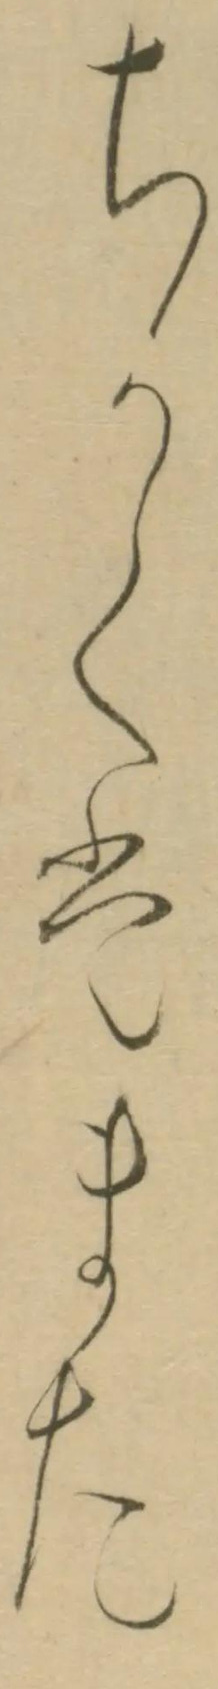ちかくはまた
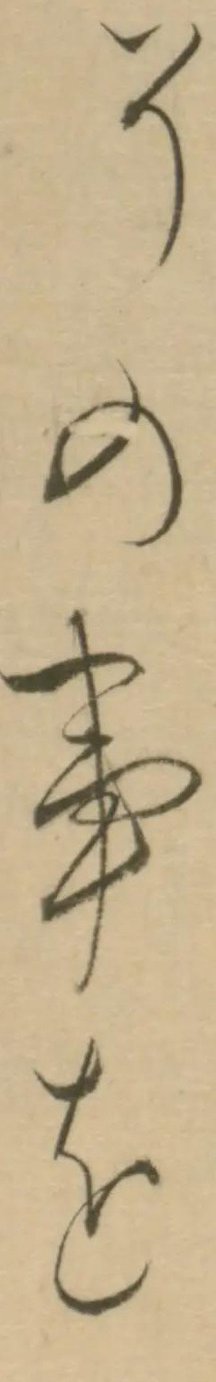その事を

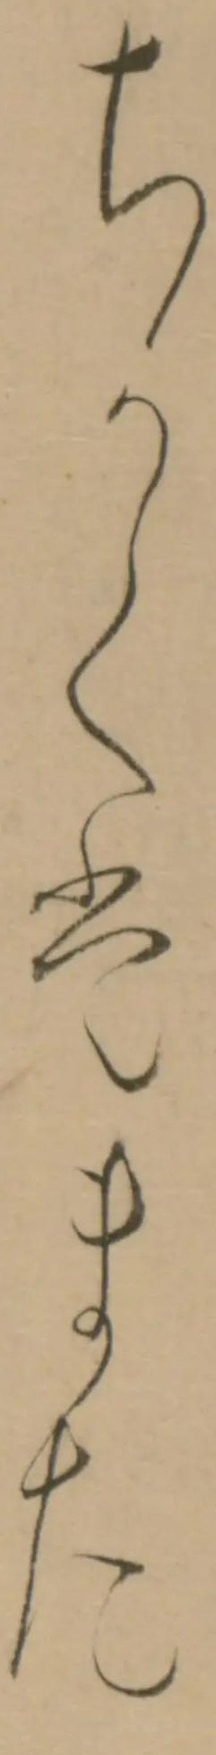ちかくはまた
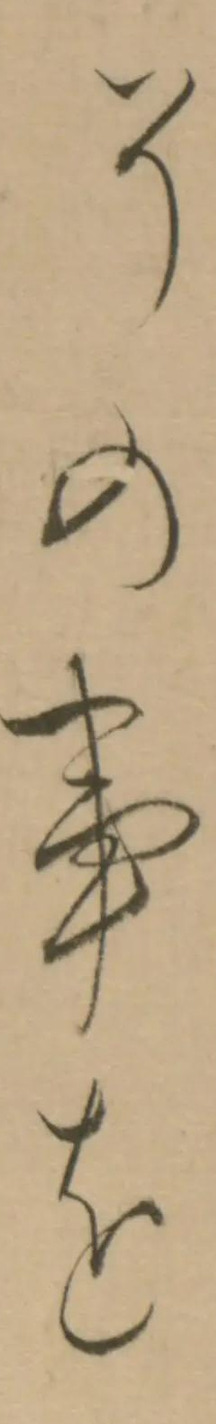その事を
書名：文永賀茂祭図. [1]
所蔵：国立国会図書館 National Diet Library, JAPAN
